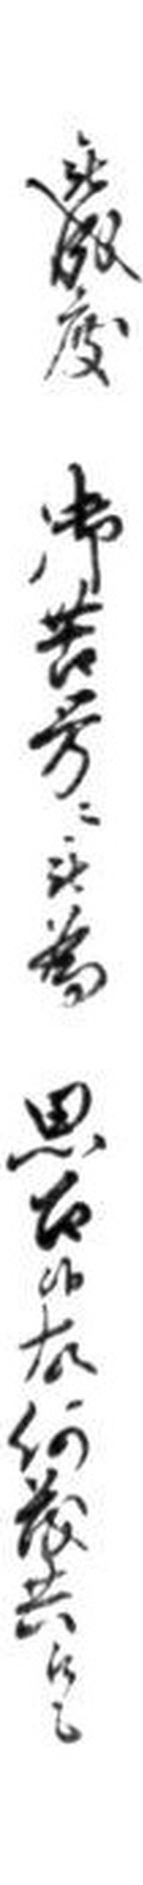被成度御苦労ニ被為思召候故何も共江も
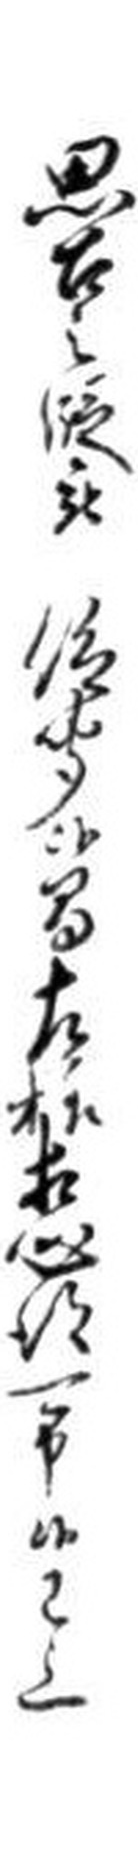思召之段被仰聞候間左様相心得可申候已上
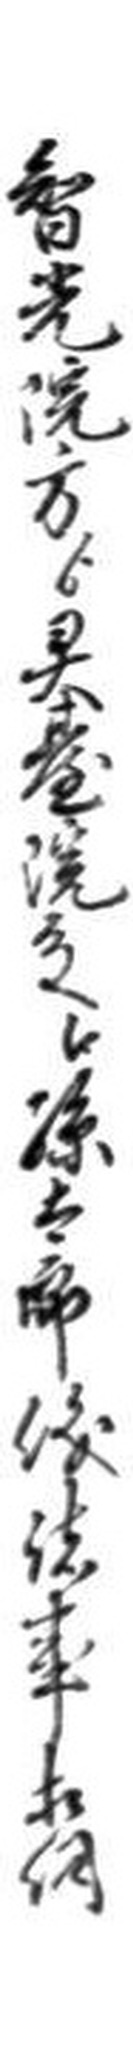智光院方ゟ霊台院殿江孫太郎儀諸事相伺
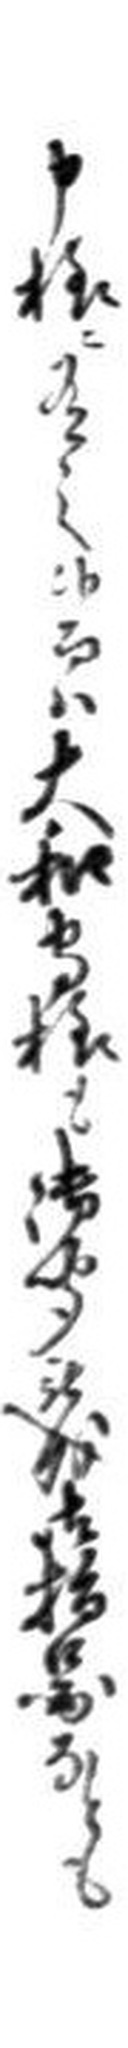申様ニ有之候而ハ大和守様も御聞被成御指図なとも
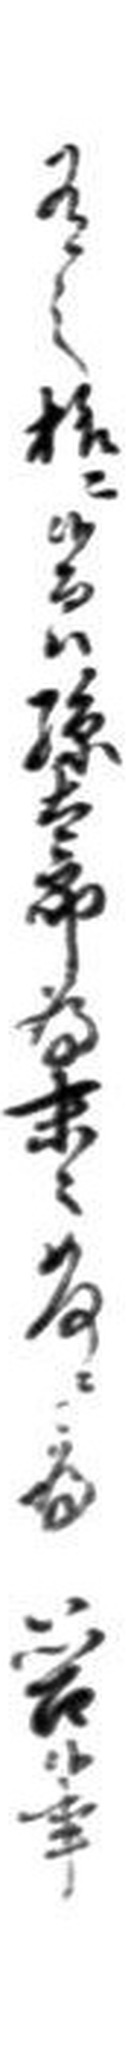有之様ニ而ハ孫太郎為末々如何ニ被為思召候事
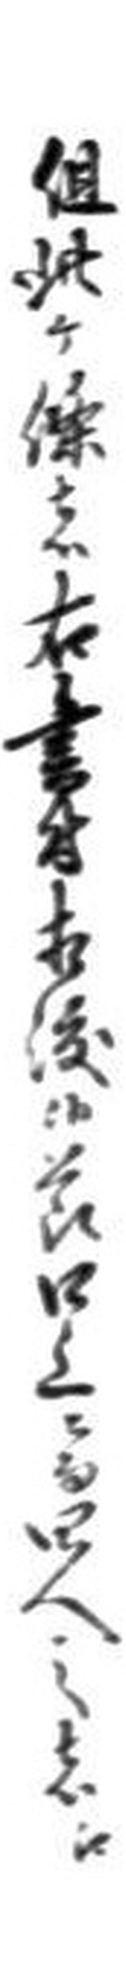但此ヶ条者右書付相渡候節口上ニ而四人之者江
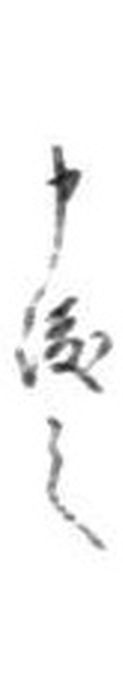申渡之
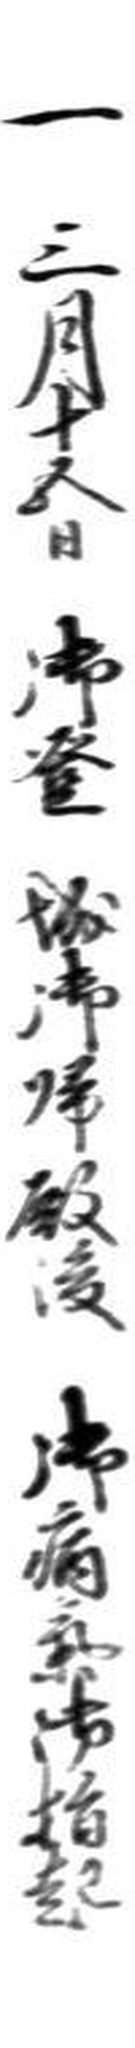一三月十五日御登城御帰殿後御病気御指起
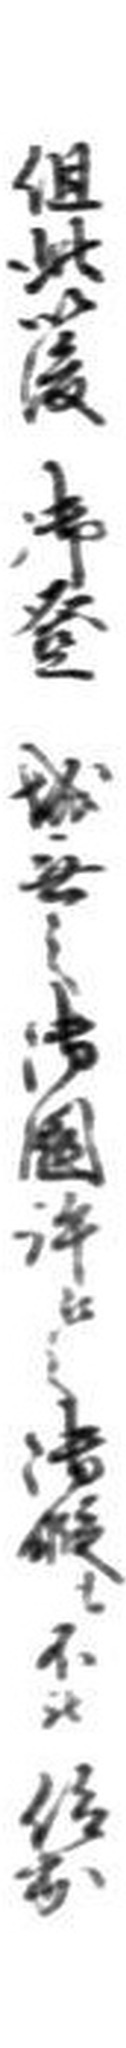但此以後御登城無之御国許江之御暇も不被仰出
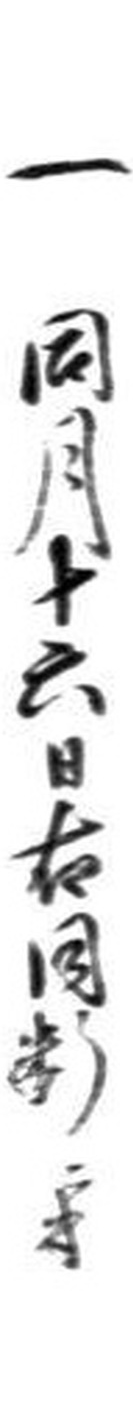一同月十六日右同断ニ付

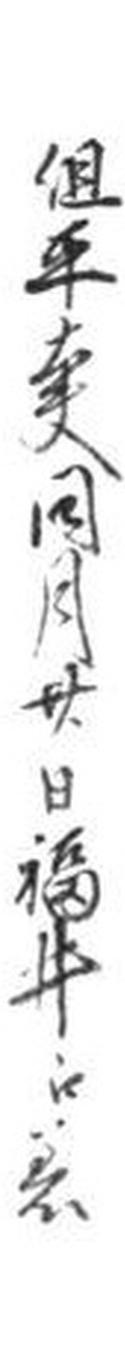但平大夫同月廿日福井江着
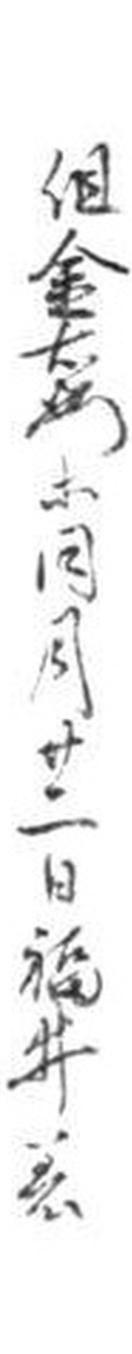但金右衛門等同月廿二日福井着
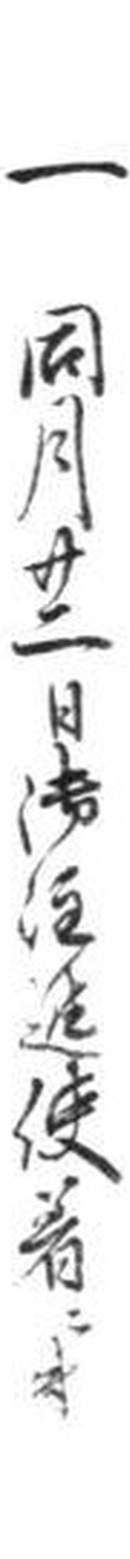一同月廿二日御注進使者ニ付
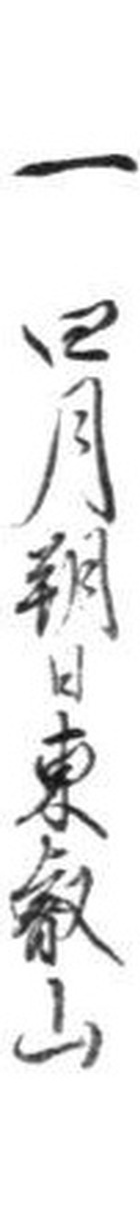一四月朔日東叡山
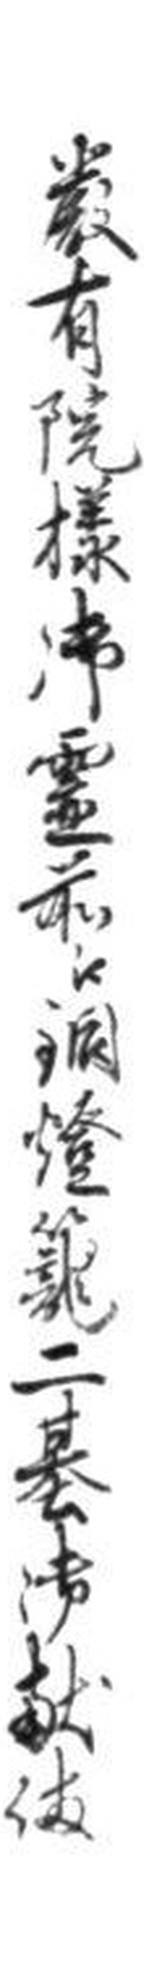厳有院様御霊前江銅燈籠二基御献備
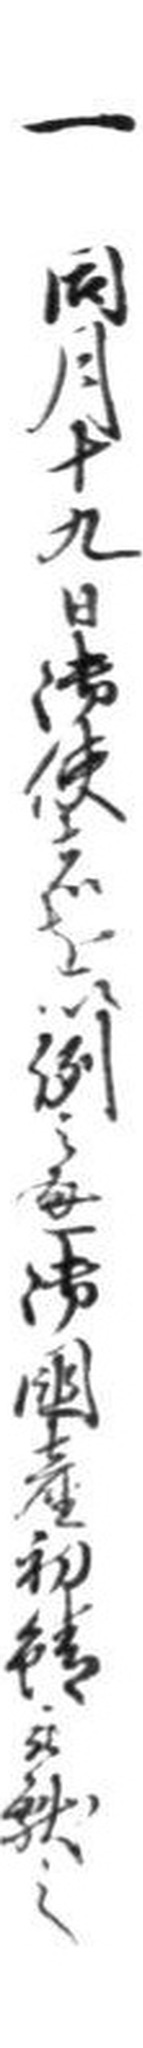一同月十九日御使者を以例之通御国産初鯖被献之
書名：家譜 十五 綱昌公 従天和元年到元禄十二年
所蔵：福井県文書館 Fukui Prefectural Archives
